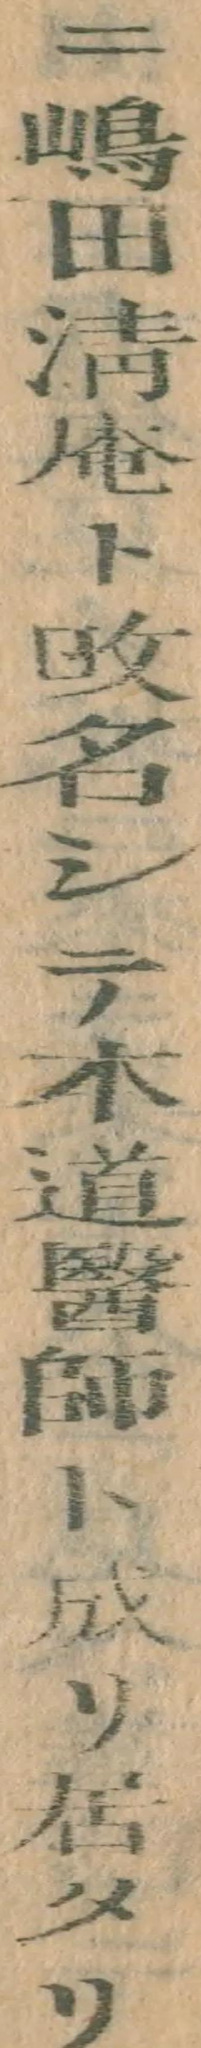ニ島田清庵ト改名シテ本道医師ト成リ居タリ
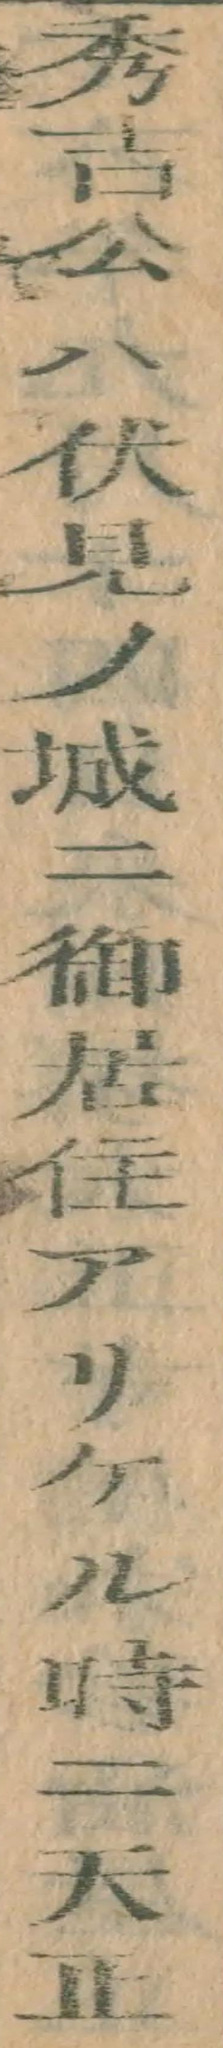秀吉公ハ伏見ノ城ニ御居住アリケル時ニ天正

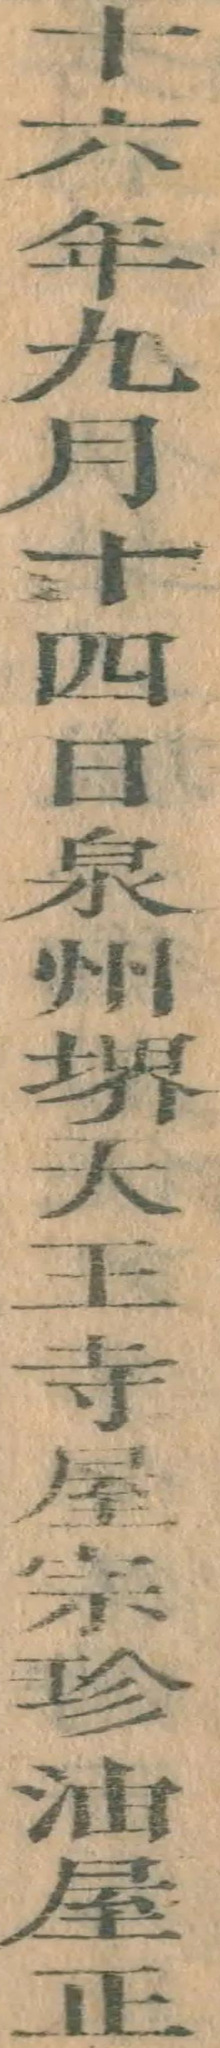十六年九月十四日泉州堺天王寺屋宗珍油屋正
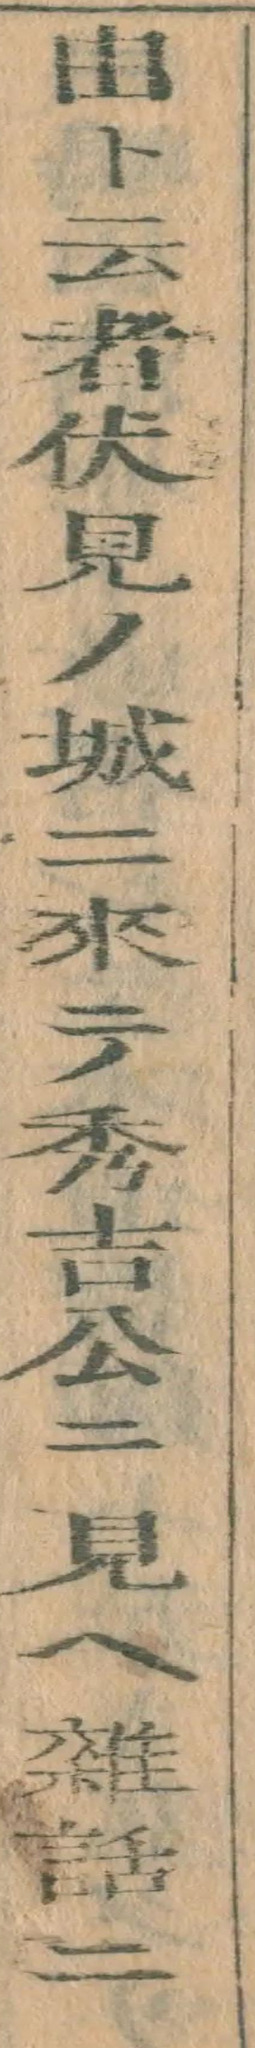由ト云者伏見ノ城ニ来テ秀吉公ニ見ヘ雑話ニ
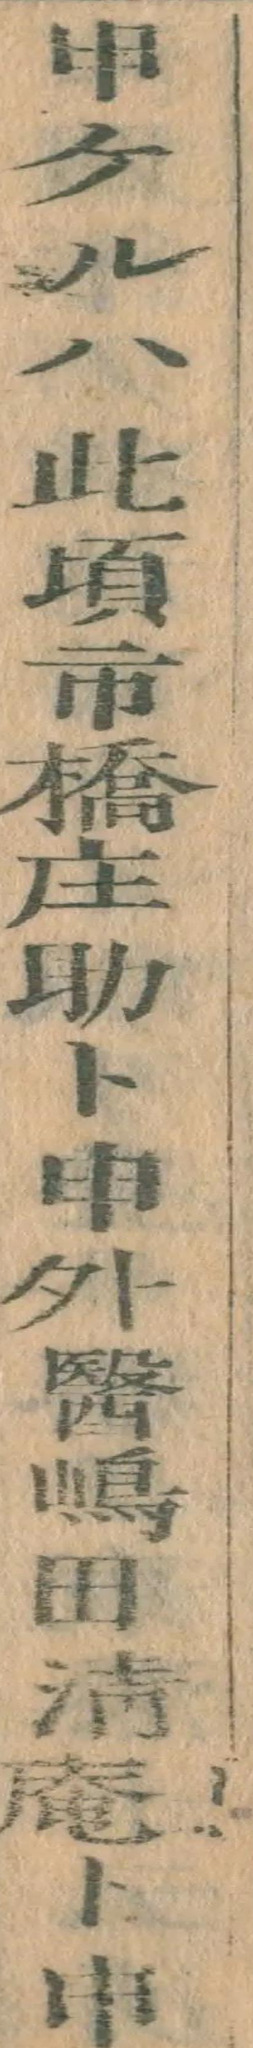申ケルハ此頃市橋庄助ト申外医島田清庵ト申
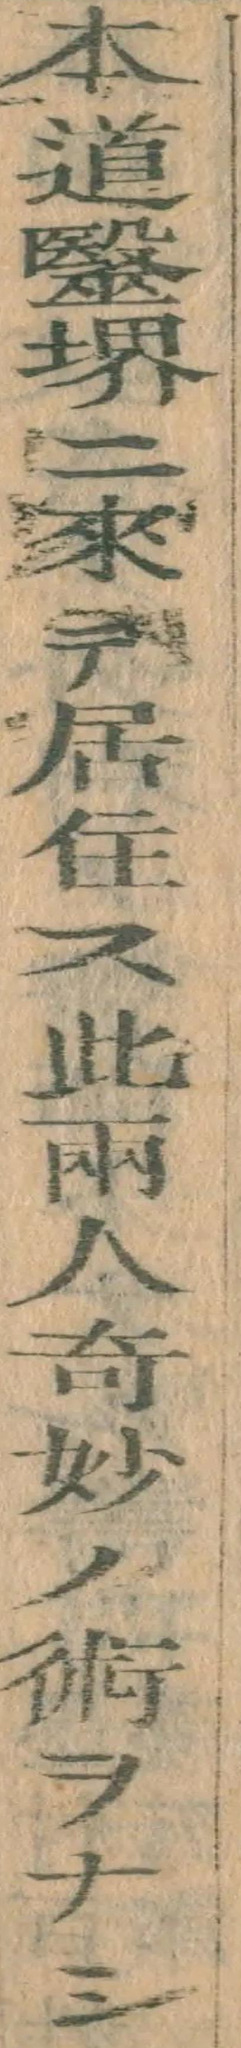本道医堺ニ来テ居住ス此両人奇妙ノ術ヲナシ
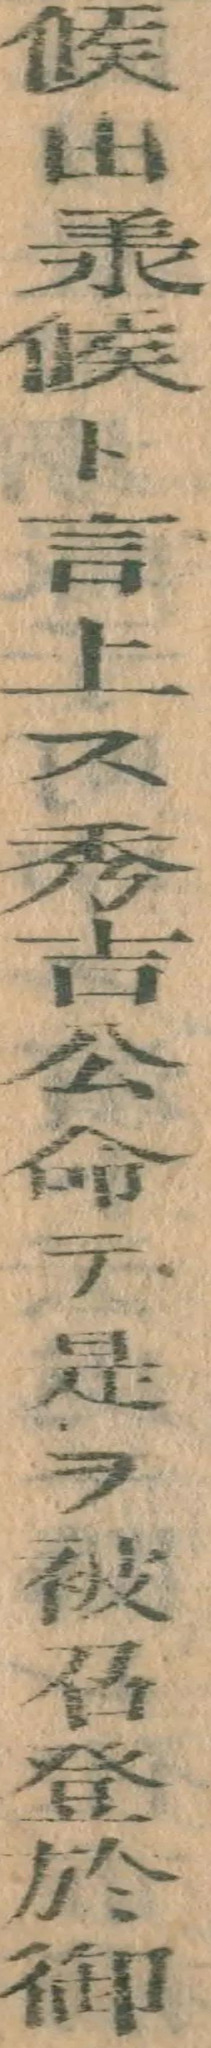候由承候ト言上ス秀吉公命テ是ヲ被召登於御
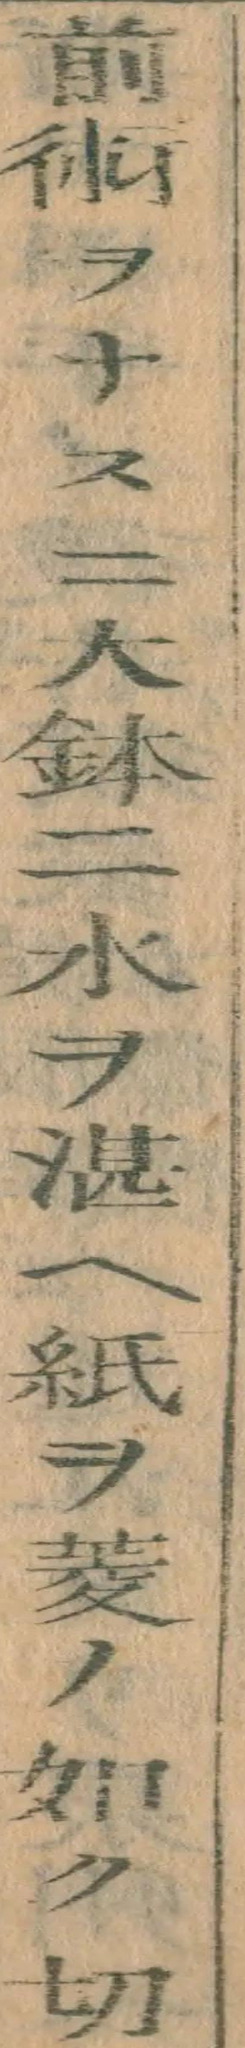前術ヲナスニ大鉢ニ水ヲ湛ヘ紙ヲ菱ノ如ク切
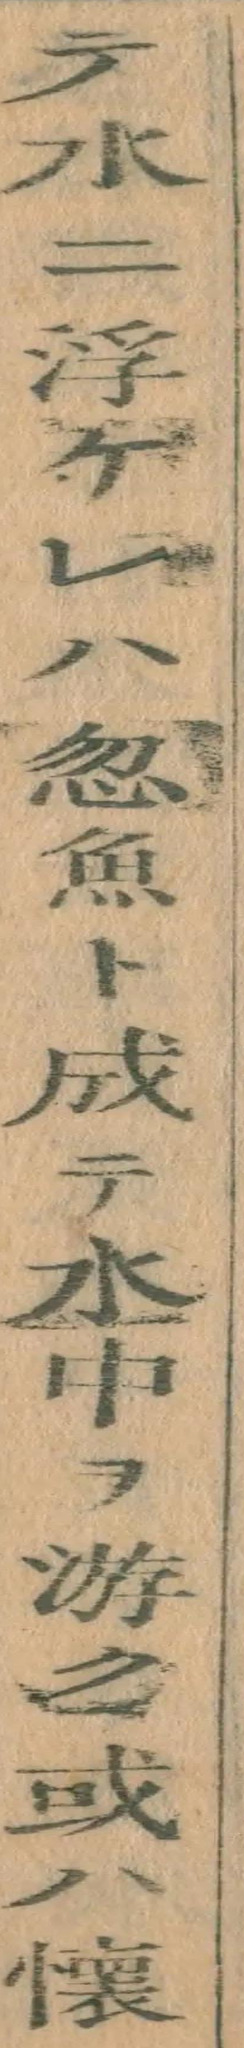テ水ニ浮ケレハ忽魚ト成テ水中ヲ游ク或ハ懐
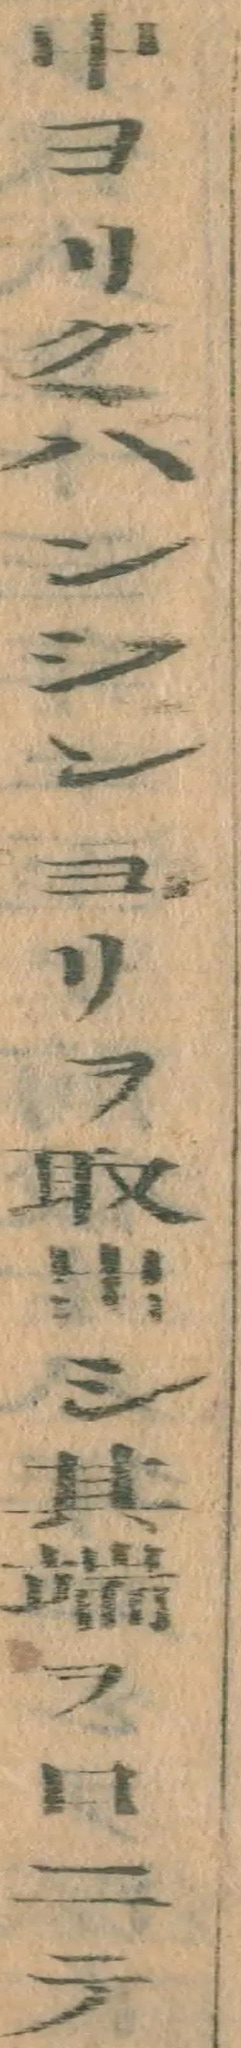中ヨリクハンシンヨリヲ取出シ其端ヲ口ニテ
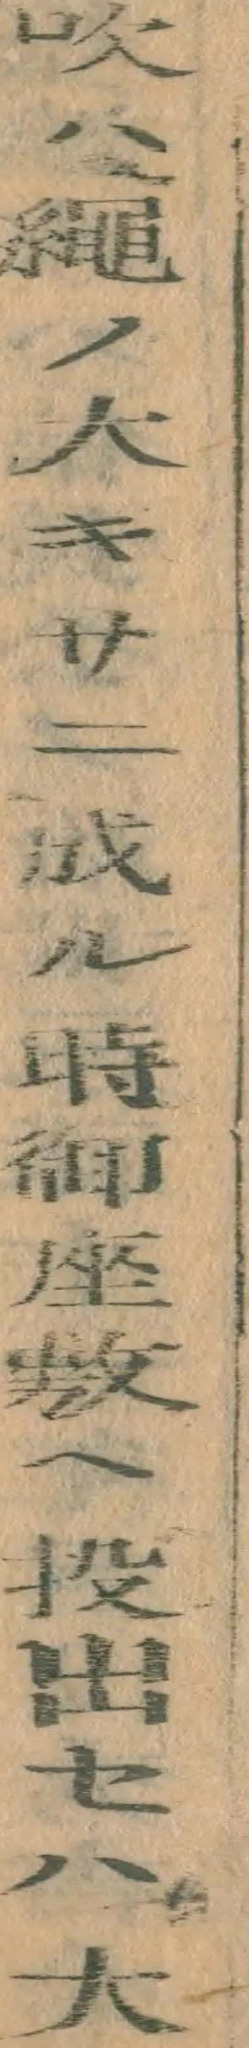吹ハ繩ノ大キサニ成ル時御座敷ヘ投出セハ大
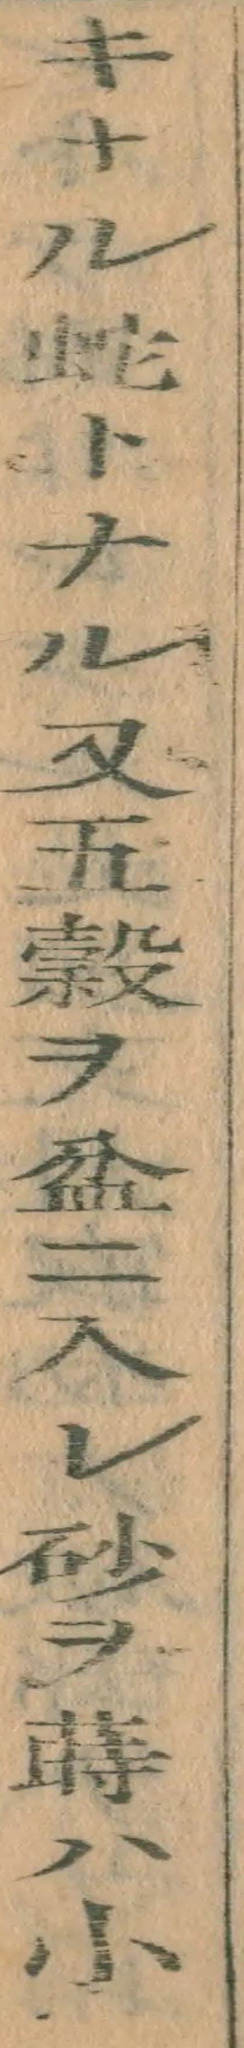キナル蛇トナル又五穀ヲ盆ニ入レ砂ヲ蒔ハ小
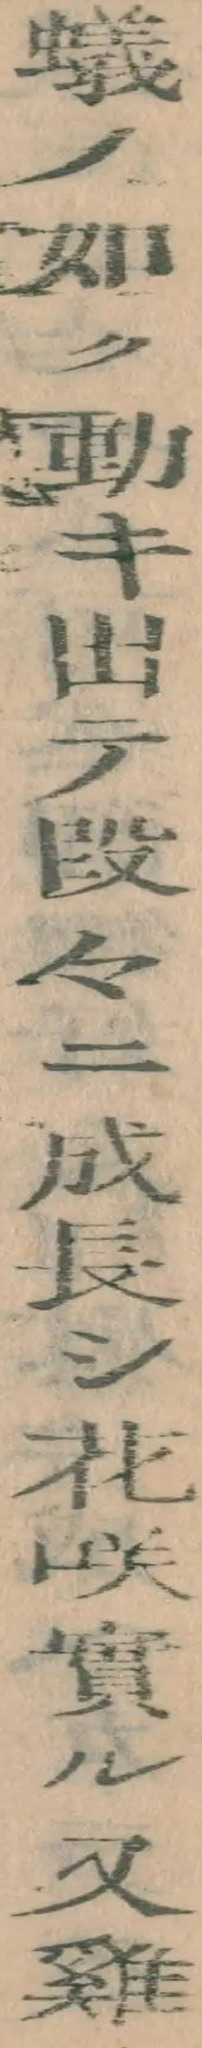蟻ノ如ク動キ出テ段々ニ成長シ花咲実ル又鶏
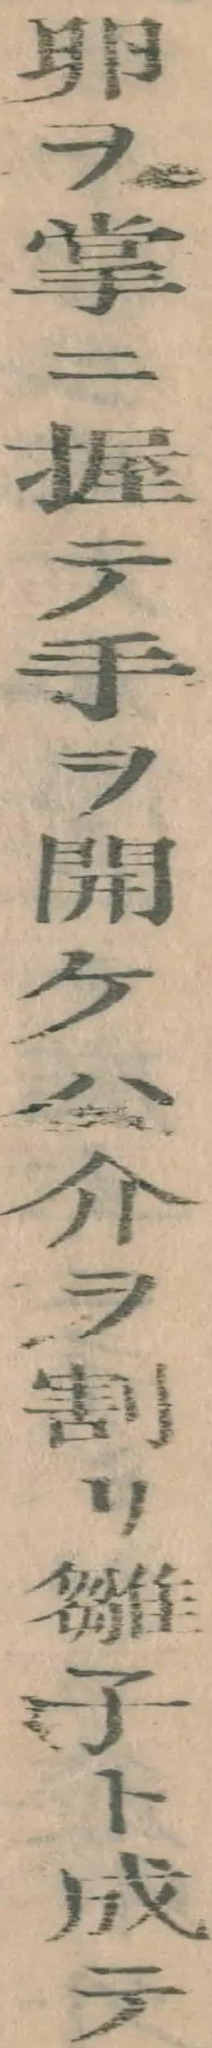卵ヲ掌ニ握テ手ヲ開ケハ介ヲ割リ雛子ト成テ
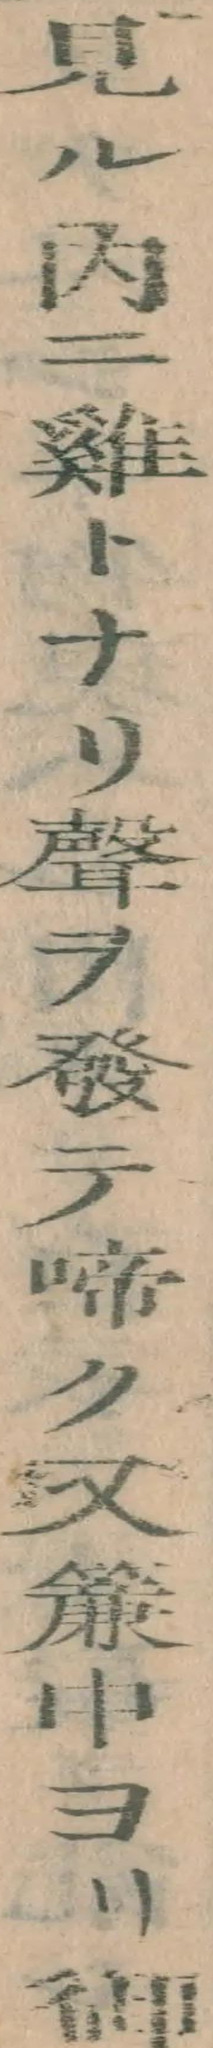見ル内ニ鶏トナリ声ヲ発テ啼ク又簾中ヨリ御
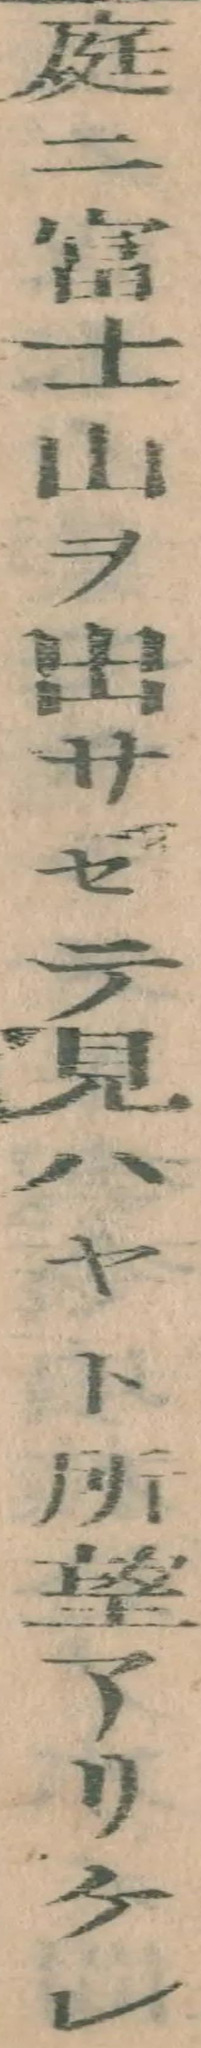庭ニ富士山ヲ出サセテ見ハヤト所望アリケレ
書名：南蛮寺興廃記
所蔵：国立国会図書館 National Diet Library, JAPAN
